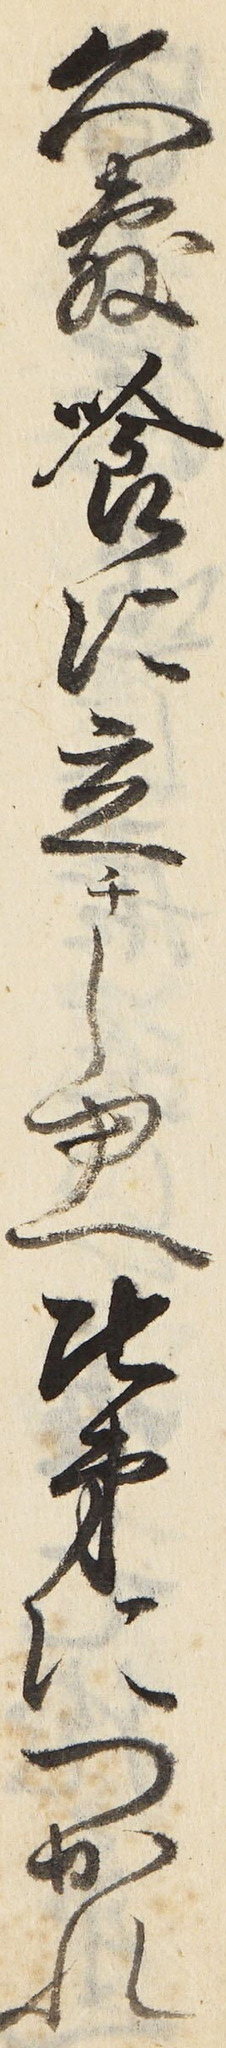久敷喰に立ちしゆへ次第につかれ
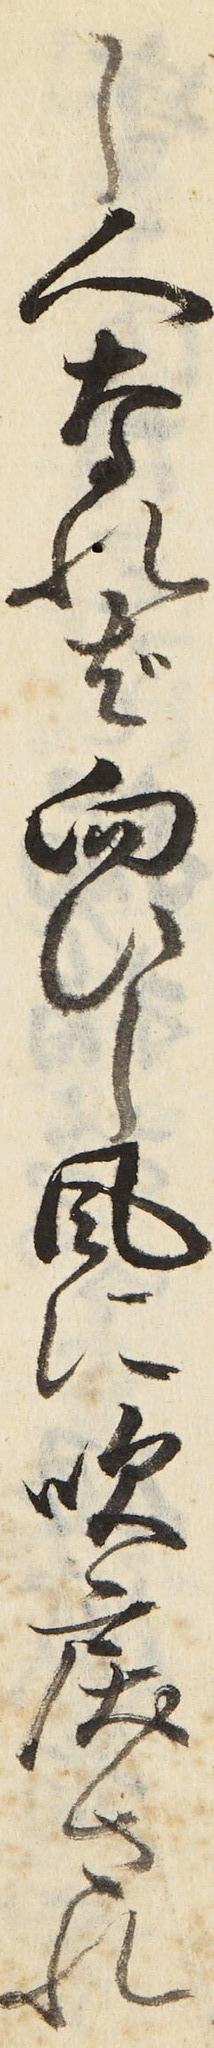し人なれば向ひし風に吹戻され
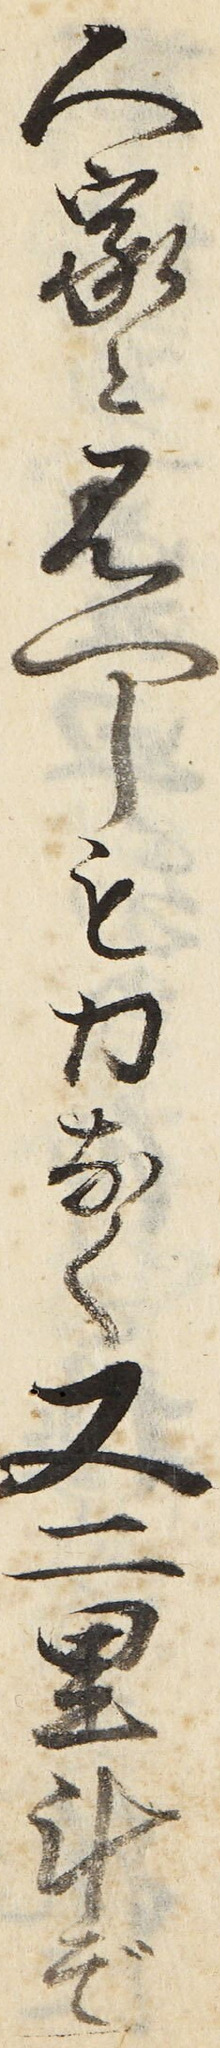人家と見へしも力なく又二里計ぞ
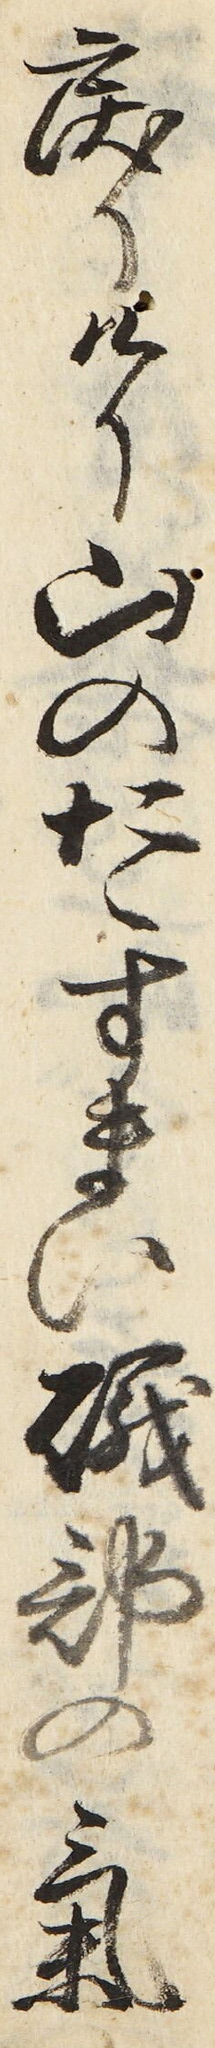戻りけり山のたゝすまい磯部の気
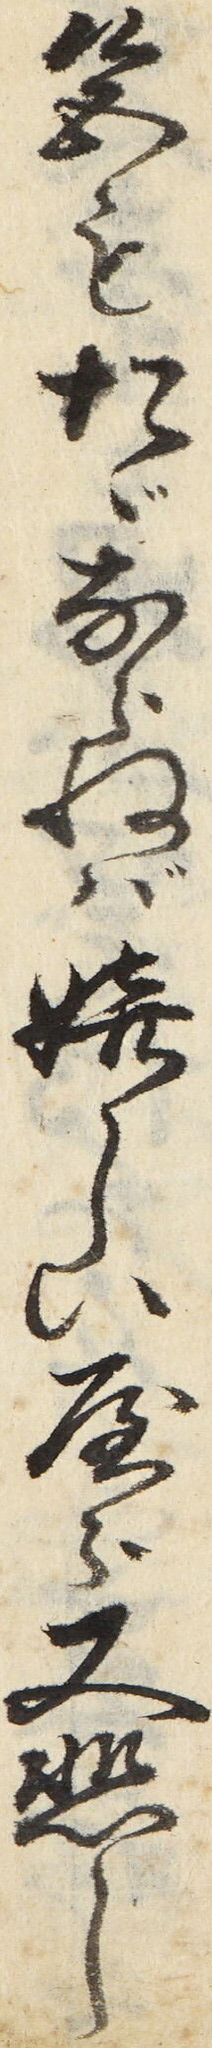色もただならねば嬉しいやら又悲し
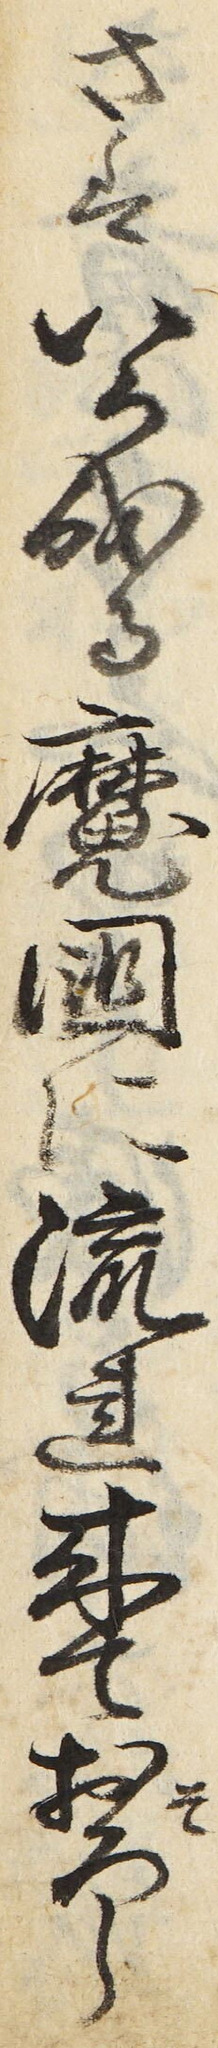さはいか成る魔国に流れ来ておそろし

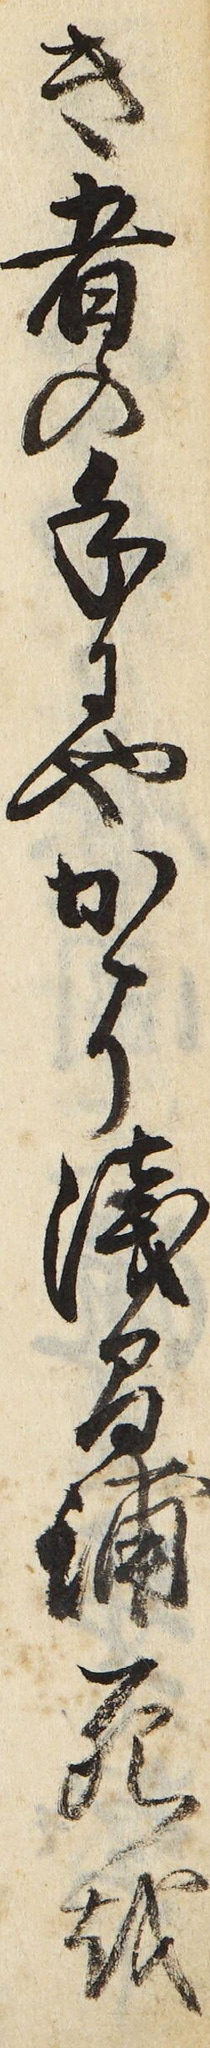き者の手にやかゝり浅間鋪死を
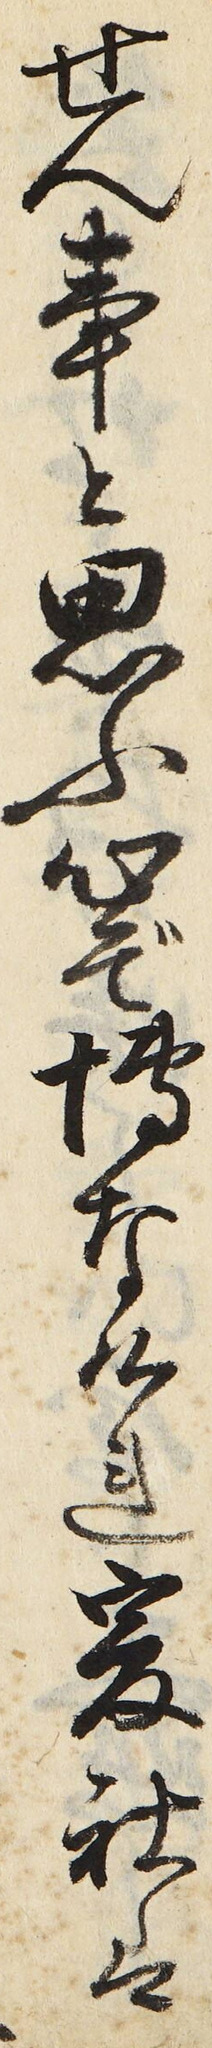せん事と思ふ心ぞ博なけれ爰社は
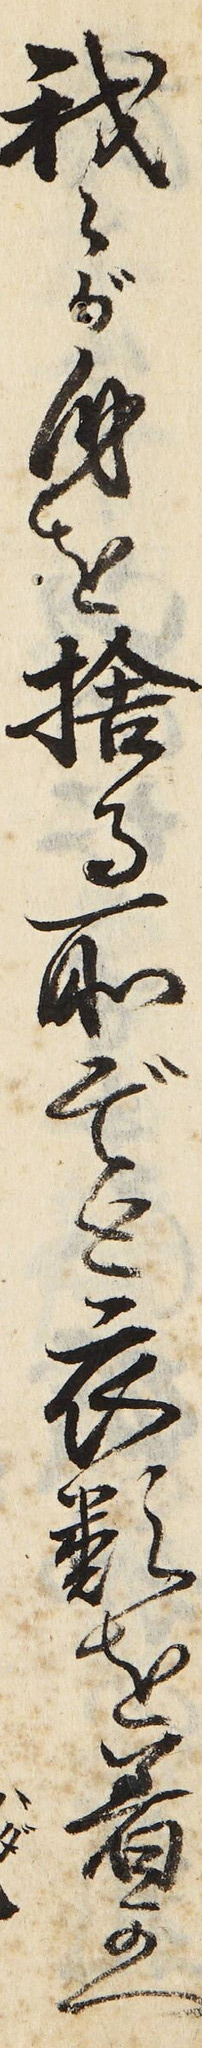我々が身を捨る所ぞと衣類を着かへ
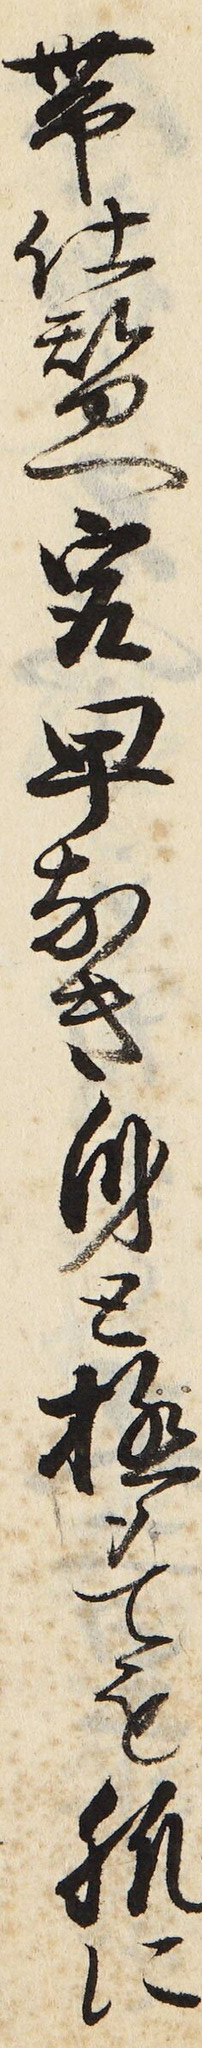帯仕替へ最早なき身と極めても肌に
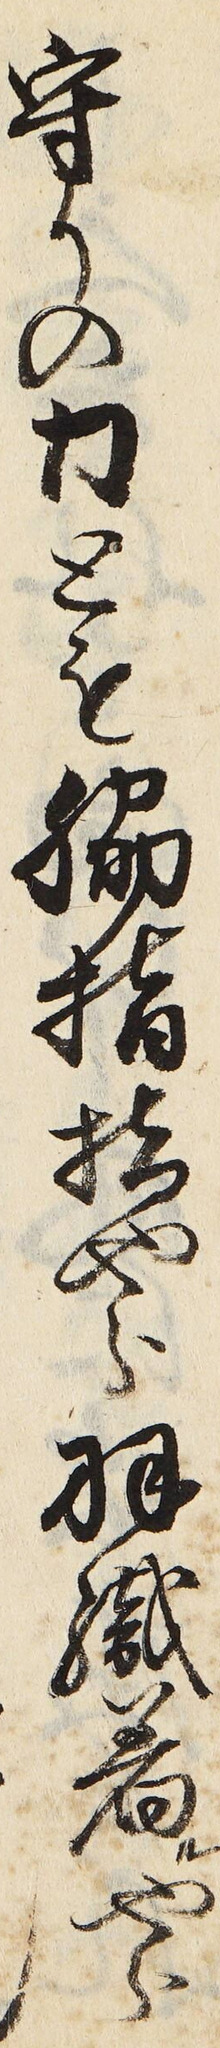守りの刀とも脇指指やら羽織着るやら
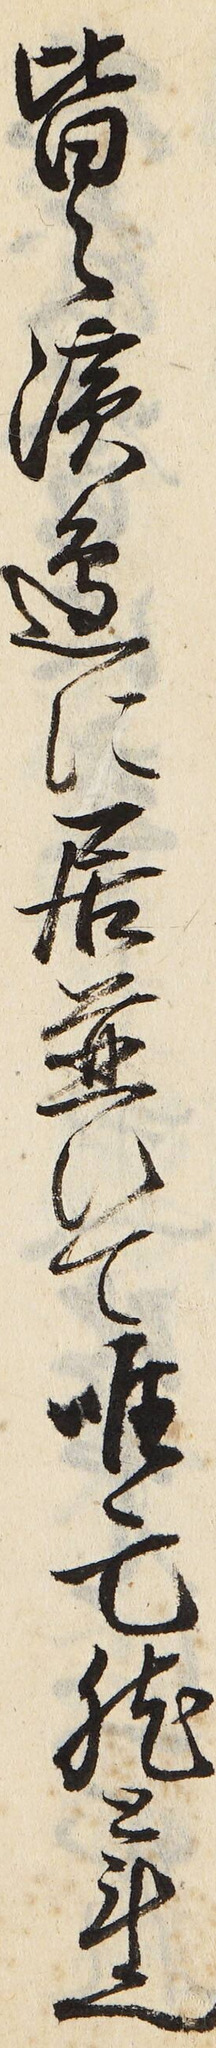皆々浜辺に居並ひて唯亡然と計也
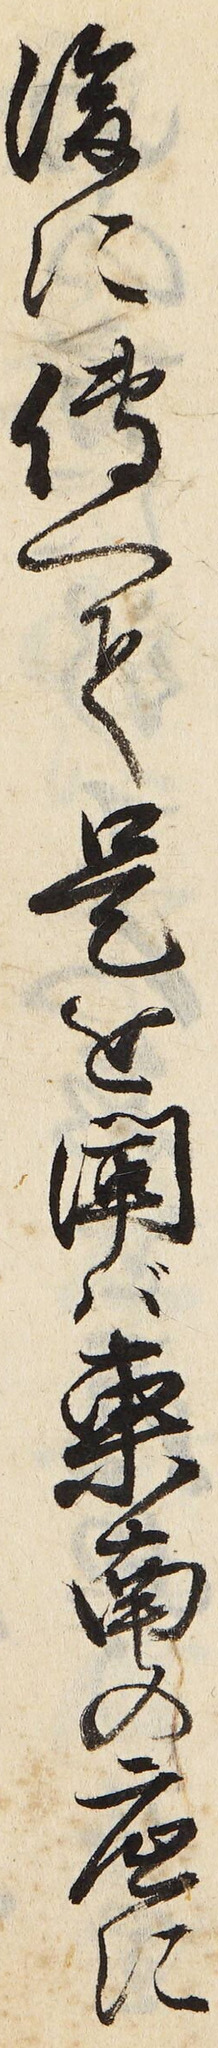後に伝へて是を聞ば東南の座に
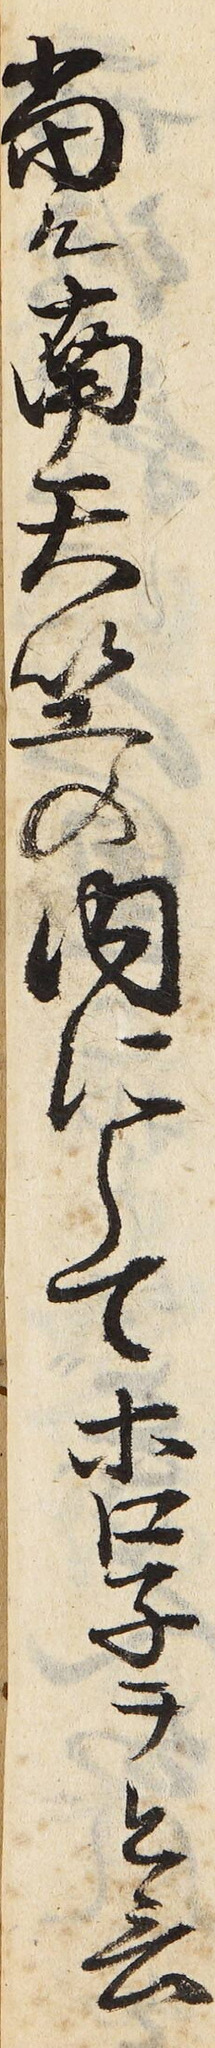当る南天竺の内にしてホロネヲと云
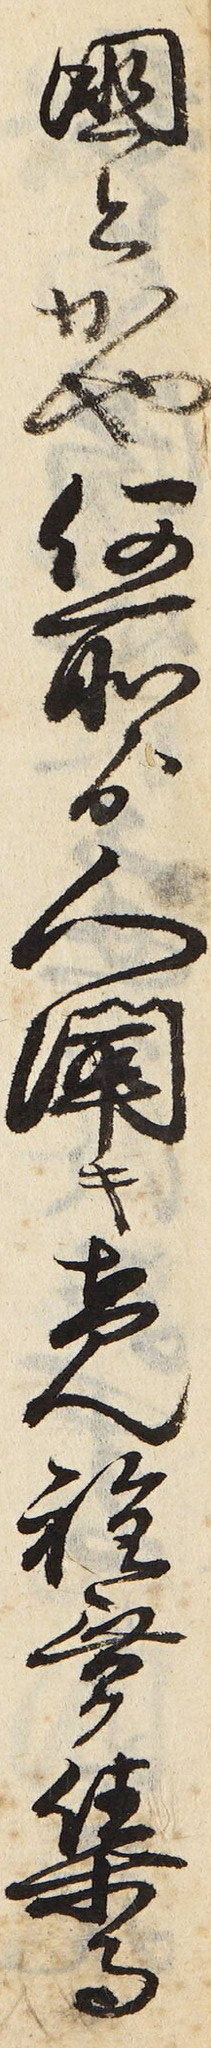国とかや何所ゟ人聞きけん程無く集る
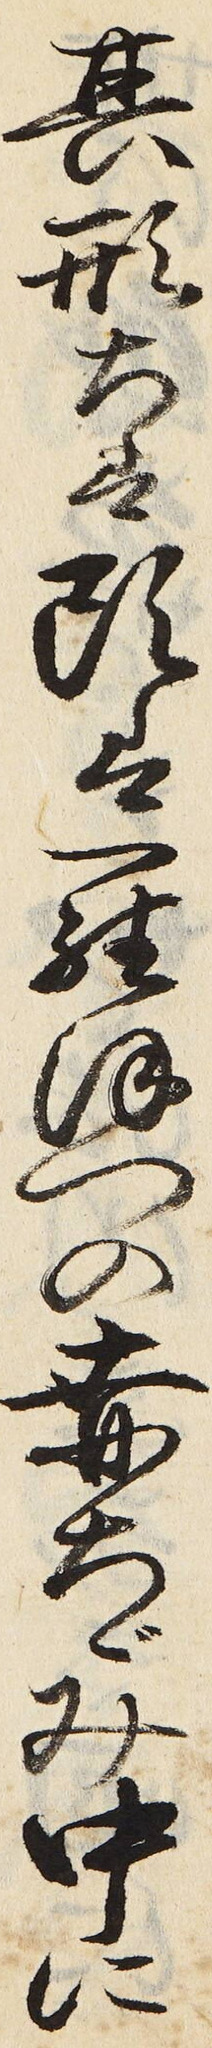其形ちは頭は羅ほつの赤ちゞみ中に
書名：華夷九年録
